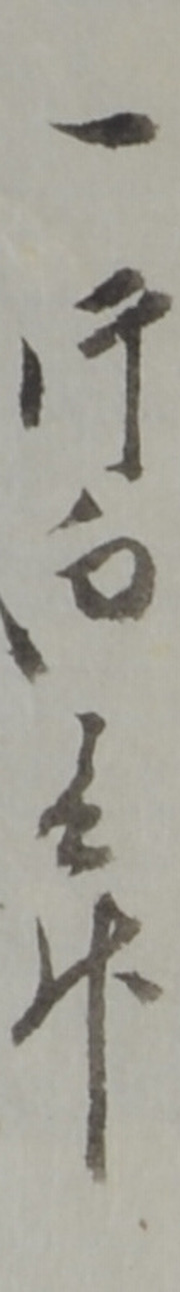一片白壱升
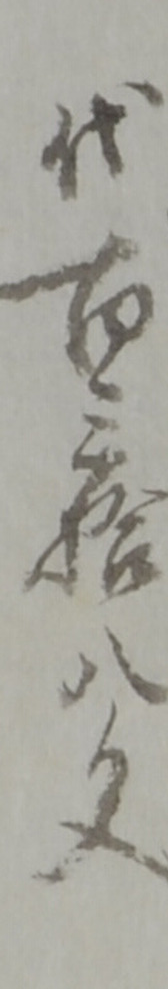代百三拾八文
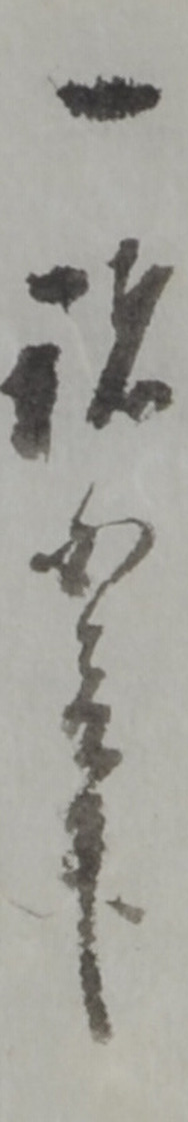一諸白壱升
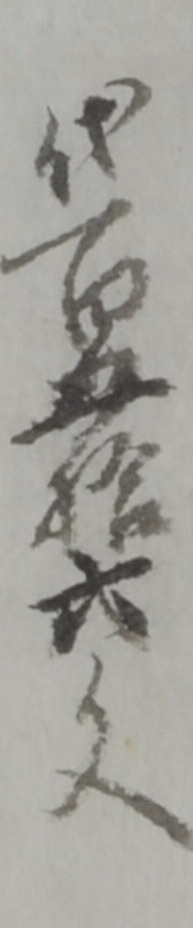代百五拾六文

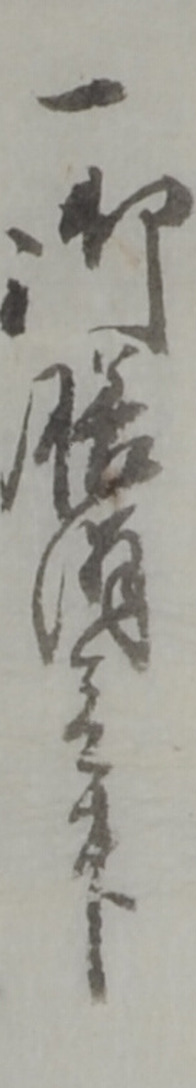一御膳酒壱升
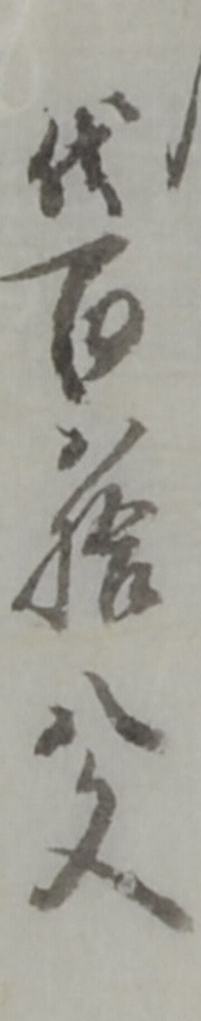代百八拾八文
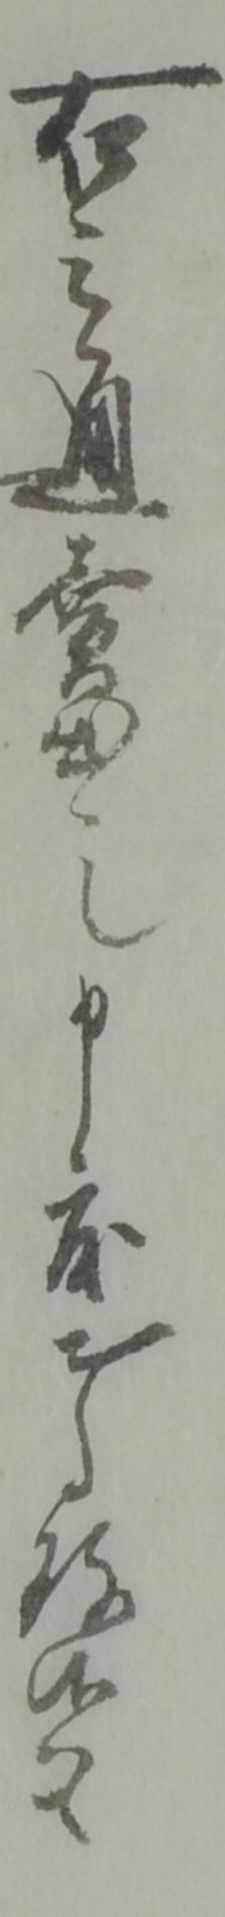右之通売出し申度奉存候以上
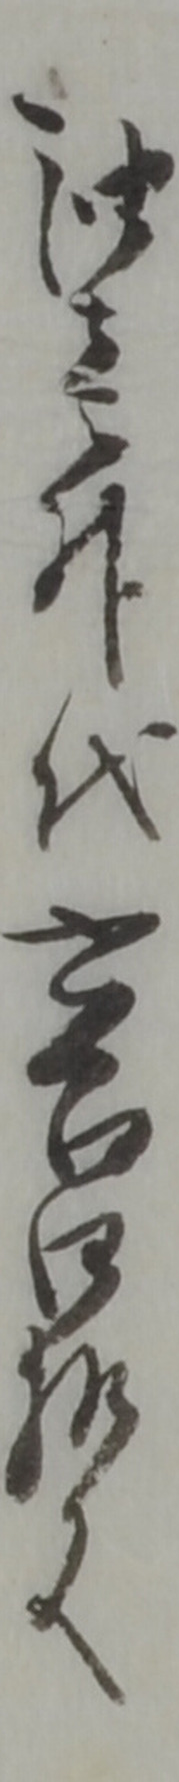一油壱升代六百四拾文
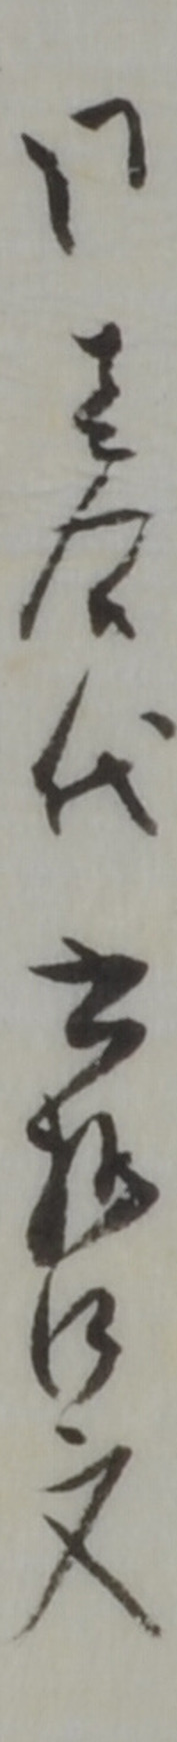一同壱合代六拾四文
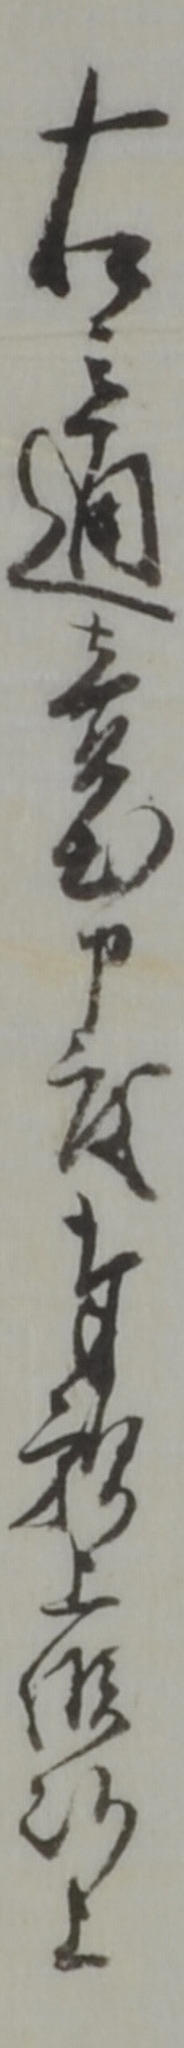右之通売出申度奉願上候以上
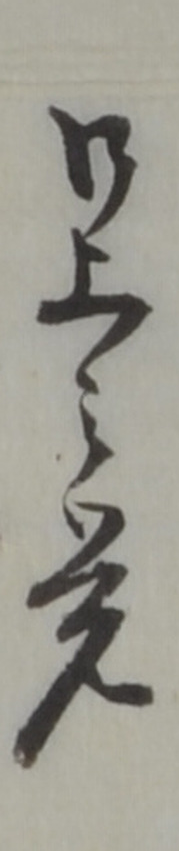口上之覚
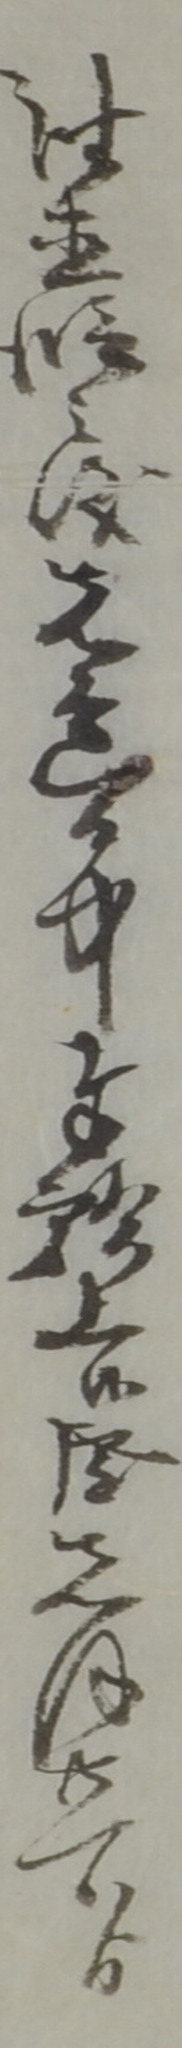油直段之儀先意ゟ中奉願上候處先月廿一日ゟ
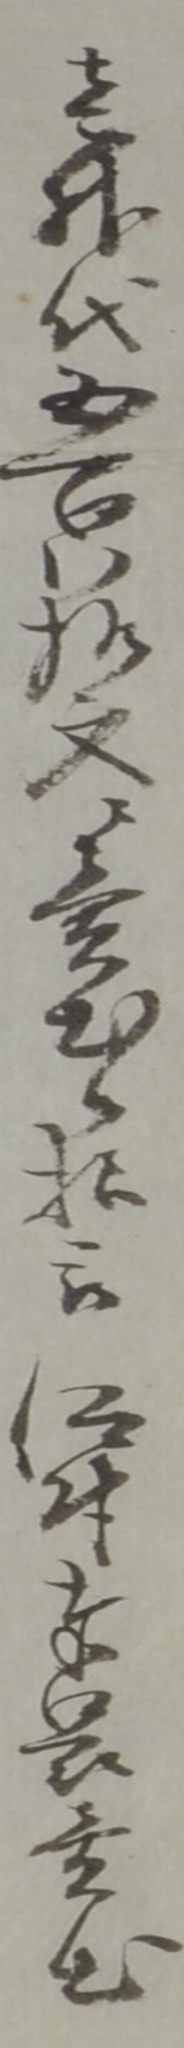壱升代五百八拾文ニ売出候様被仰付奉畏売出
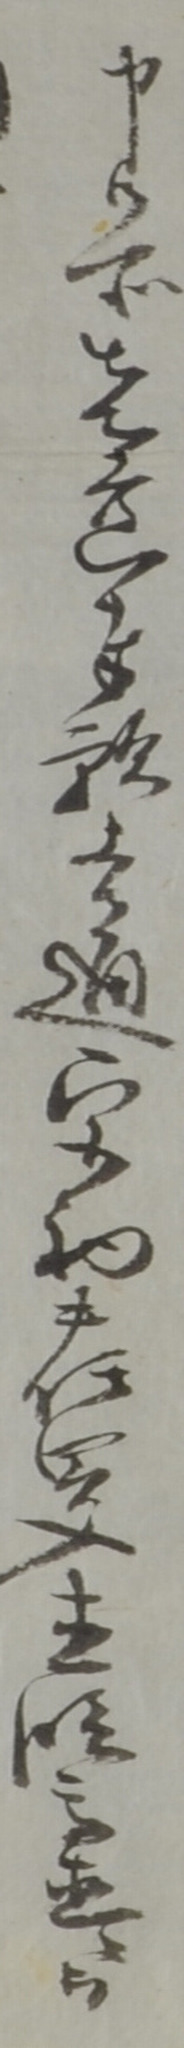申候所先達奉願上候通最初荏買入直段高直ニ而
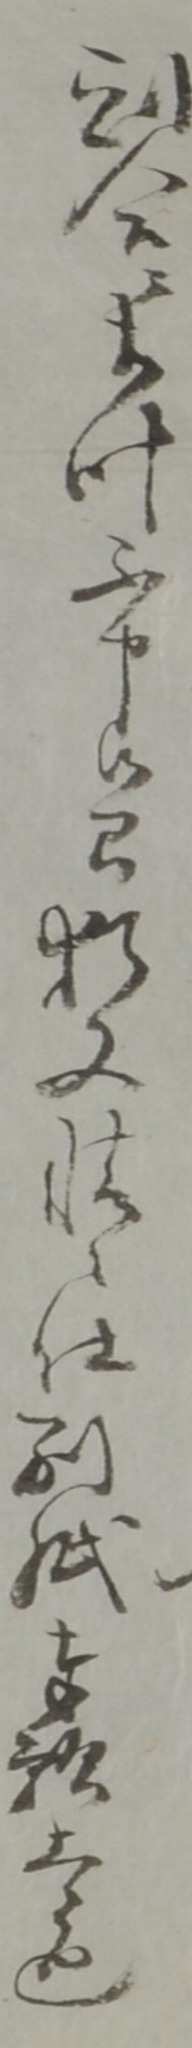刻合ニ相叶不申候間猶又情ニ仕別紙奉願上候通
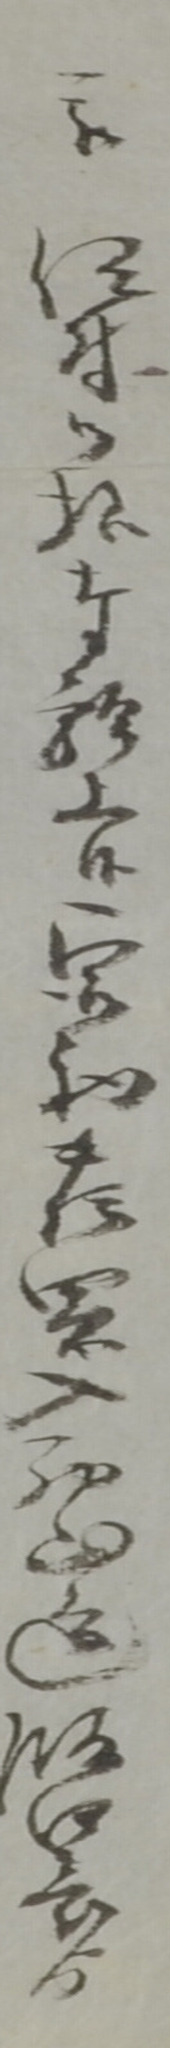被仰付候様奉願上候最初荏買入西山辺飯田表ゟ
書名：諸願書控簿
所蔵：伊那市立高遠町図書館・合同会社AMANE
